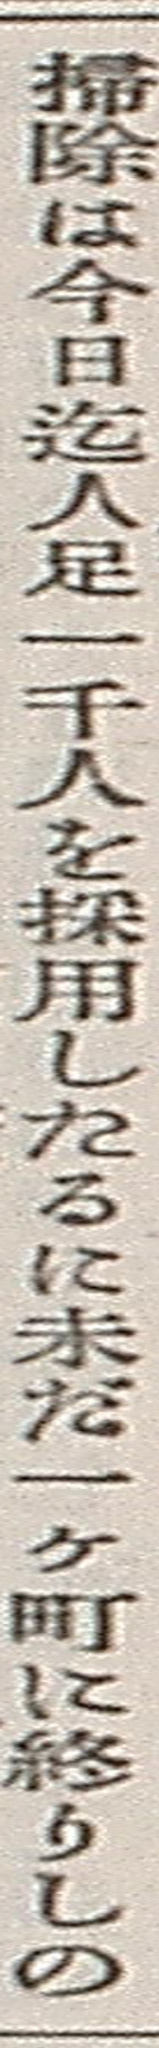掃除は今日迄人足一千人を採用したるに未だ一ヶ町に終りしの
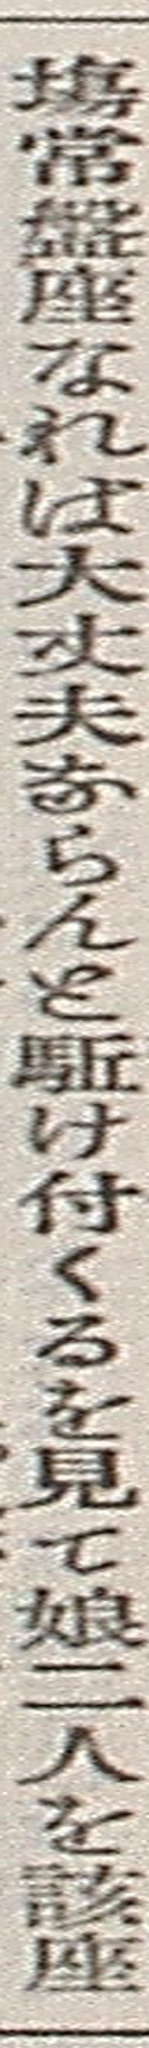場常盤座なれば大丈夫ならんと駈け付くるを見て娘二人を該座
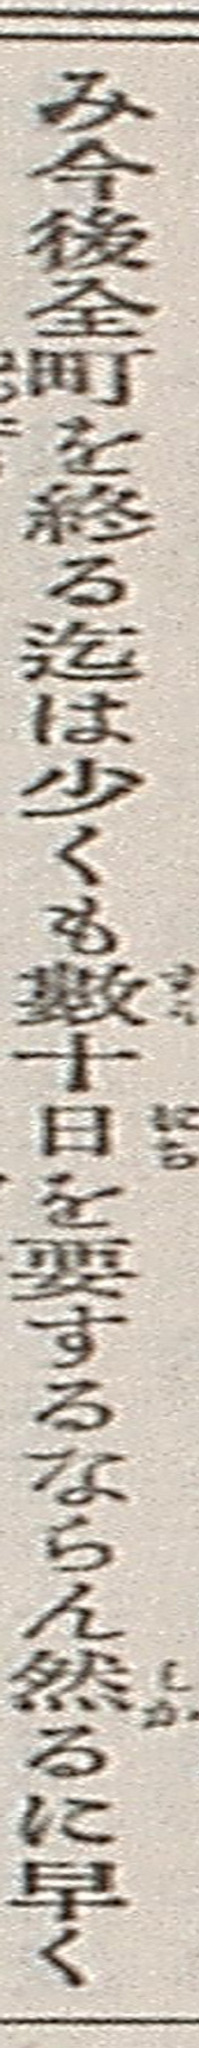み今度全町を終る迄は少くも数十日を要するならん然るに早く
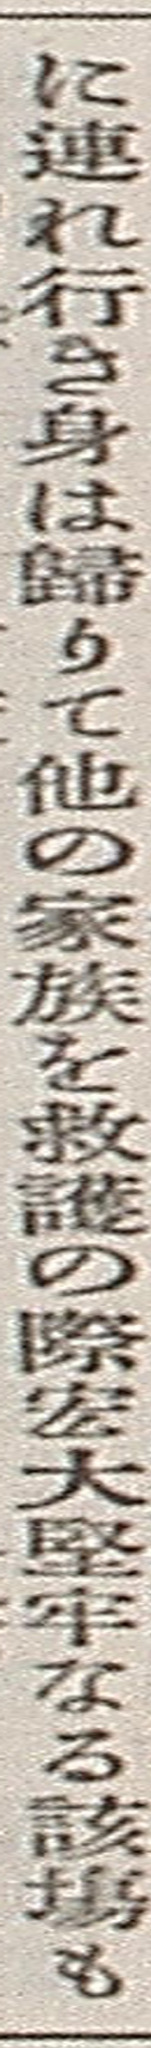に連れ行き身は帰りて他の家族を救護の際宏大堅牢なる該場も
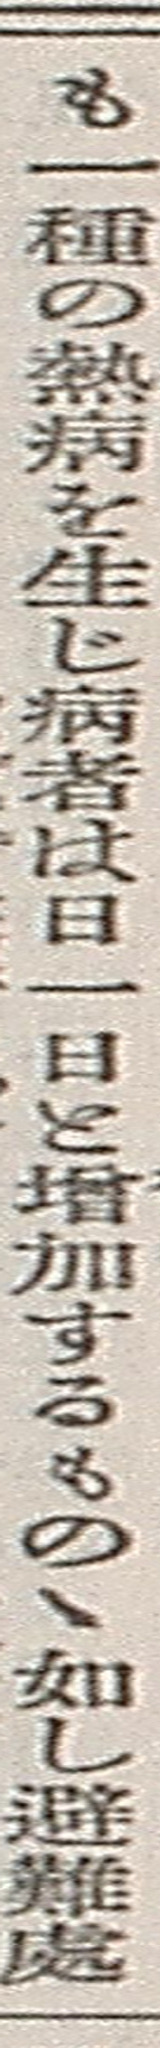も一種の熱病を生じ病者は日一日と増加するものゝ如し避難処
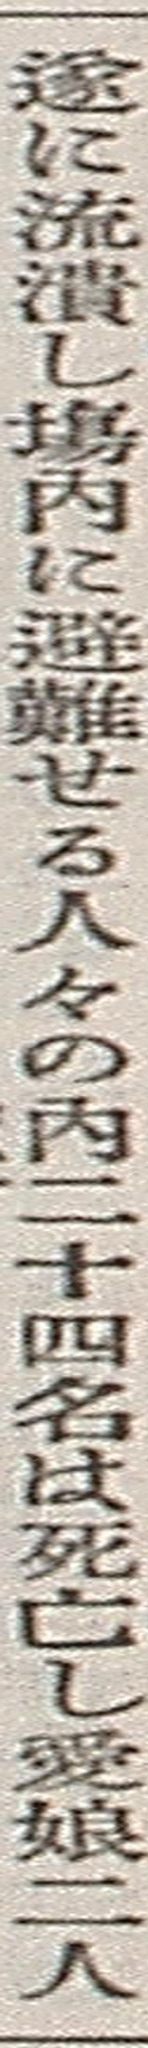遂に流潰し場内に避難せる人々の内二十四名は死亡し愛娘二人
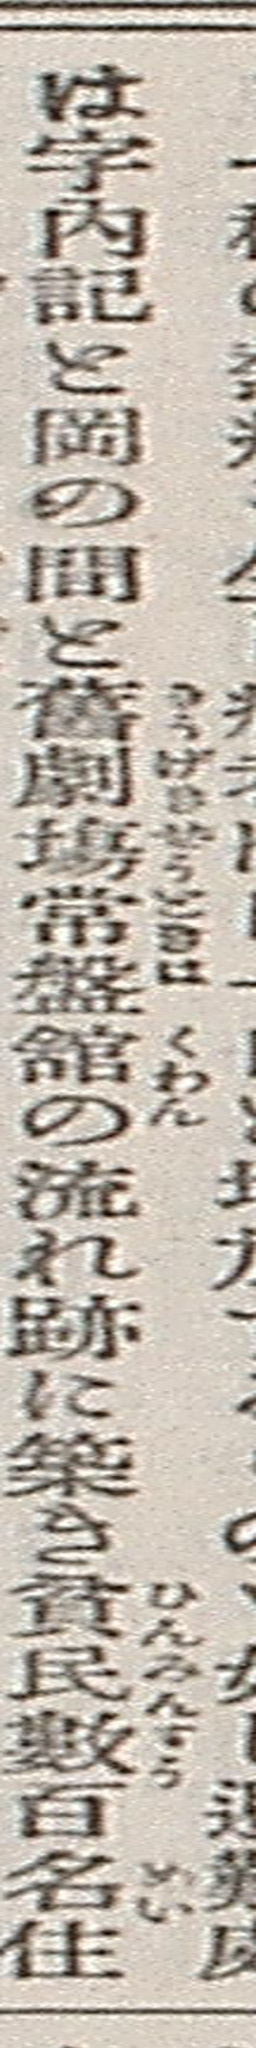は字内記と岡の間と舊劇場常盤館の流れ跡に築き貧民数百名住
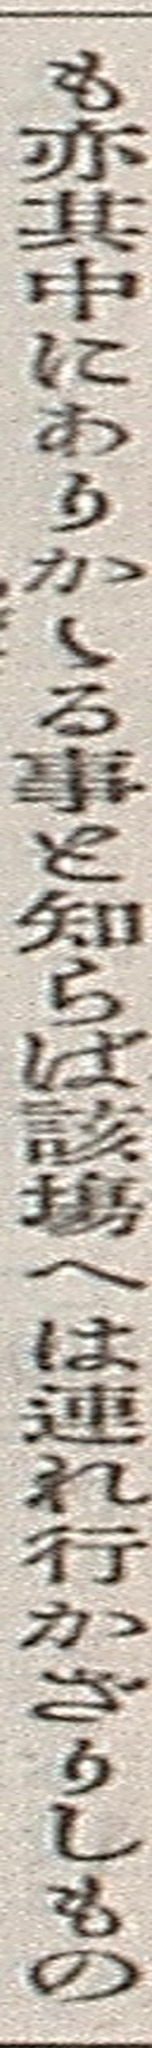も亦其中にありかゝる事と知らば該場へは連れ行かざりしもの
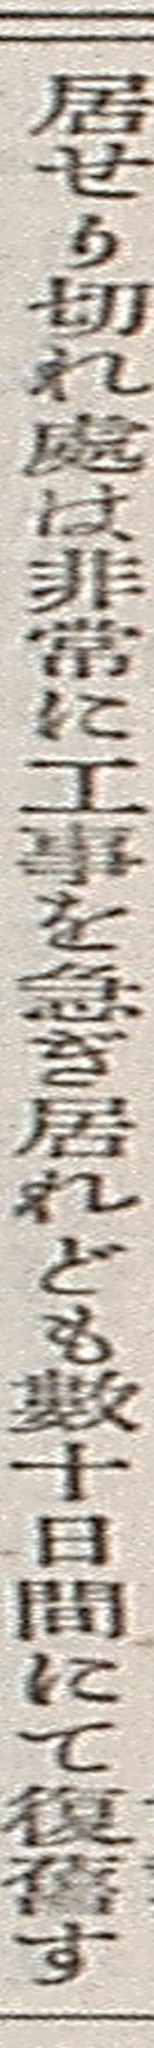居せり切れ処は非常に工事を急ぎ居れども数十日間にて復舊す
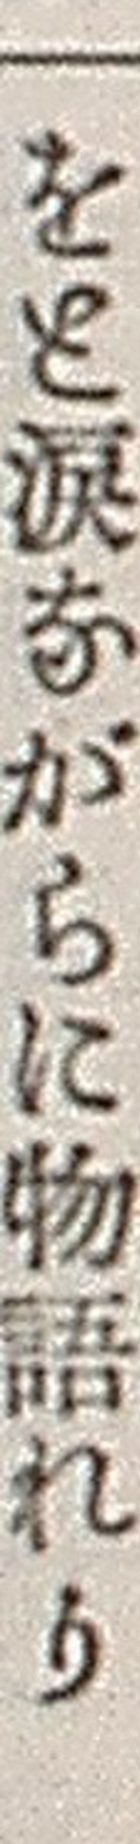をと涙ながらに物語れり
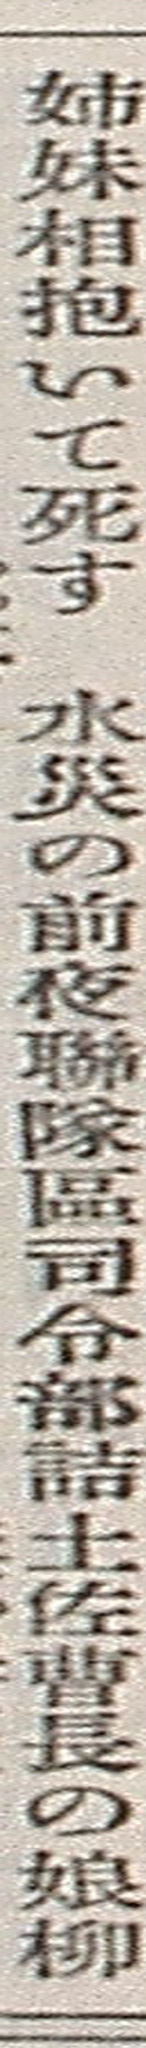姉妹相抱いて死す水災の前夜聯隊區司令部詰土佐曹長の娘柳
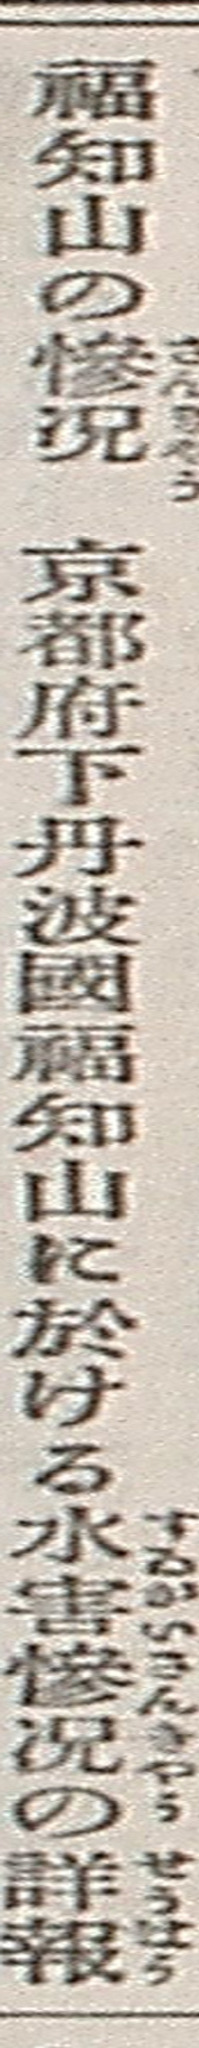福知山の惨況京都府下丹波国福知山に於ける水害惨況の詳報
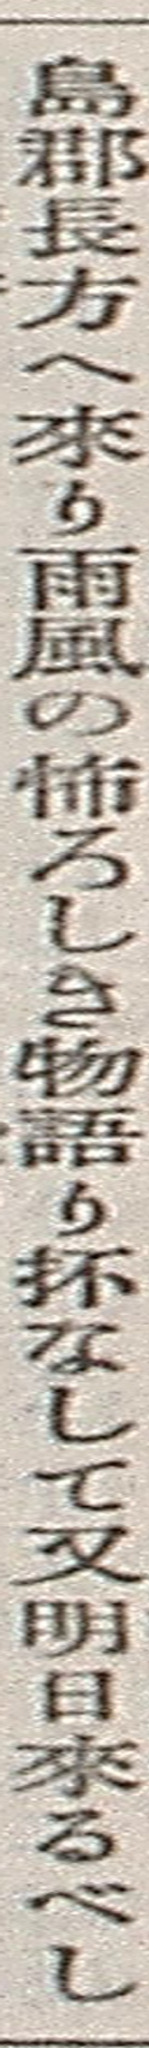島群長方へ来り雨風の怖ろしき物語り抔なして又明日来るべし
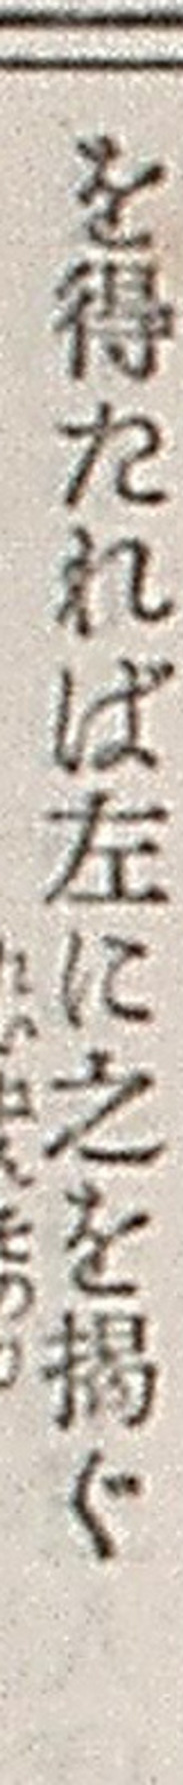を得たれば左に之を掲ぐ
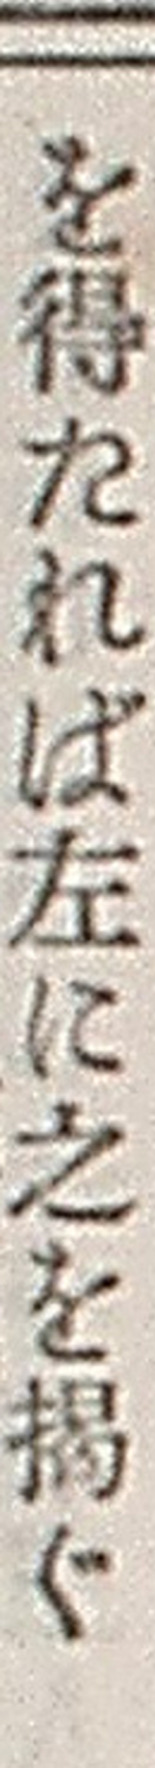を得たれば左に之を掲ぐ
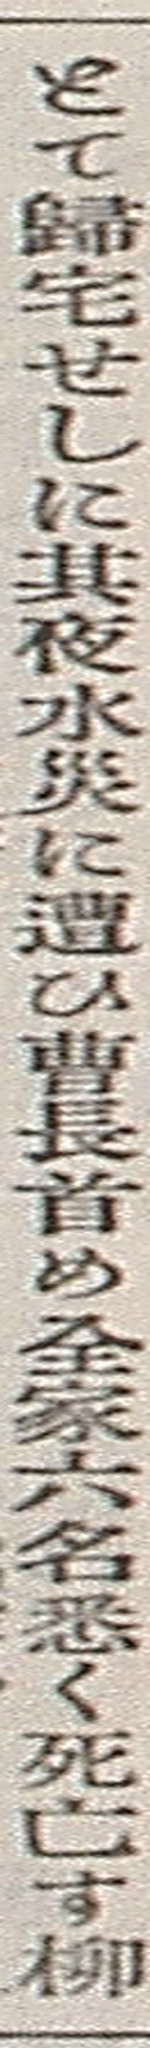とて帰宅せしに其夜水災に遭ひ曹長首め全家族六名悉く死亡す柳
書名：風俗畫報臨時増刊第百二十六號　洪水被害録（中）
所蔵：東京大学地震研究所図書室 Earthquake Research Institute Library, The University of Tokyo, JAPAN
